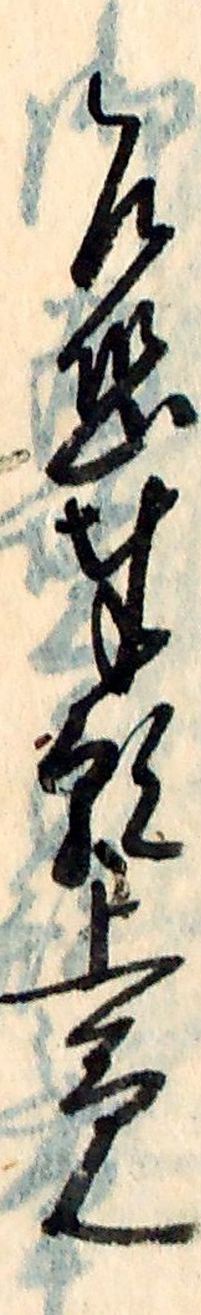乍恐奉願上覚
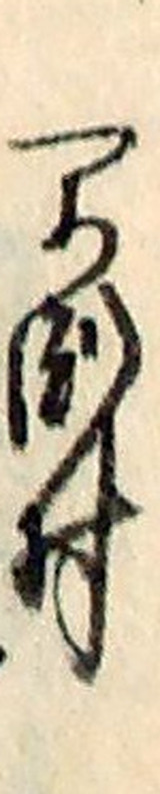早淵村
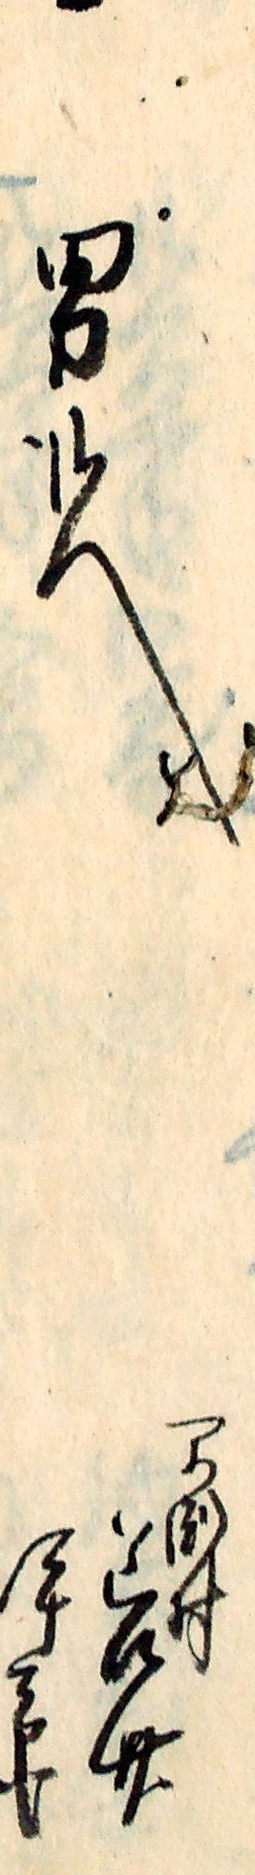一男弐人善介
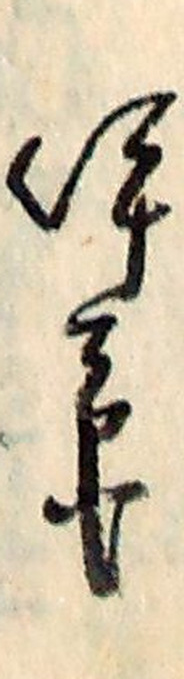伊兵衛
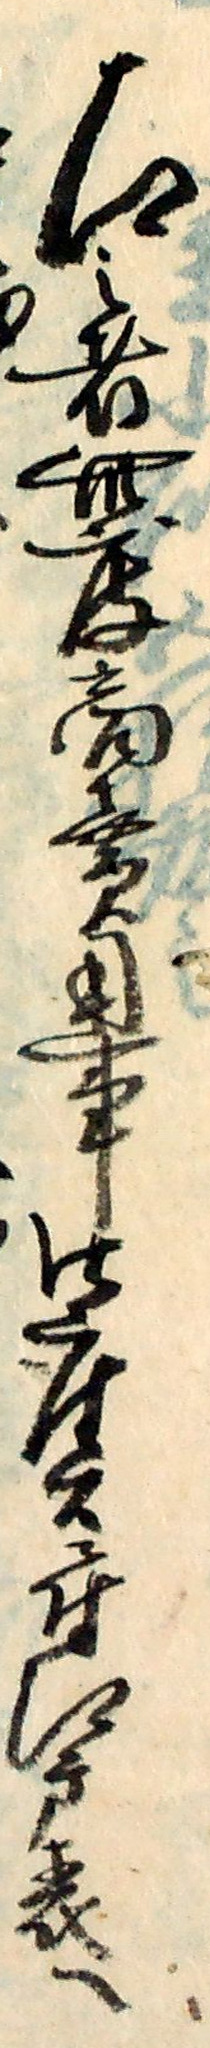右之者此度商売用事御座候に付江戸表へ
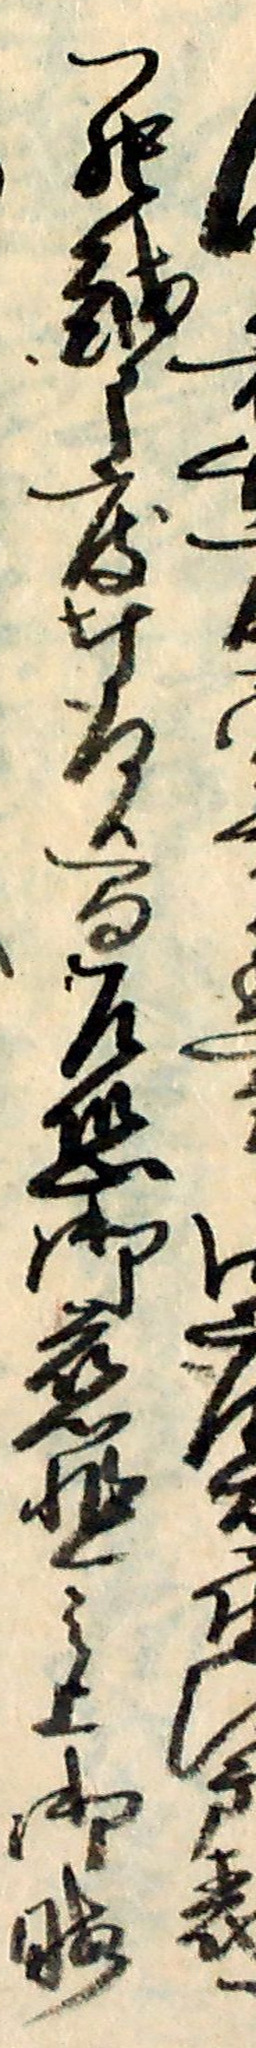罷越申度奉存候間乍恐御慈悲之上御暇
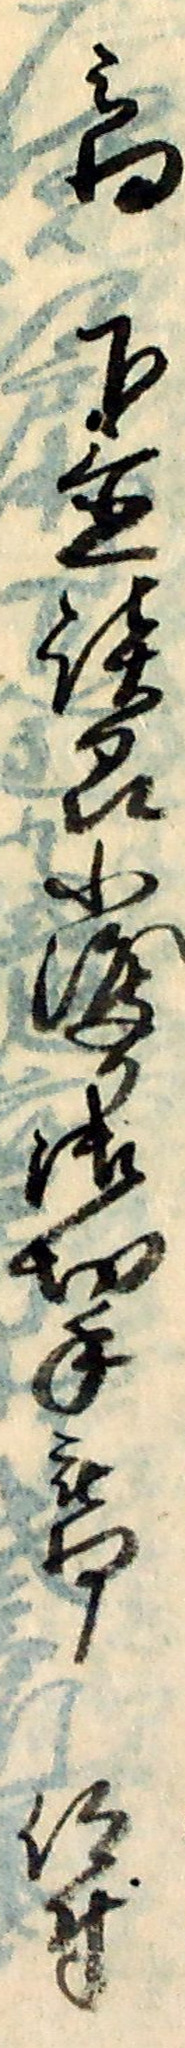被為下置淡州小渡り御切手被為仰付
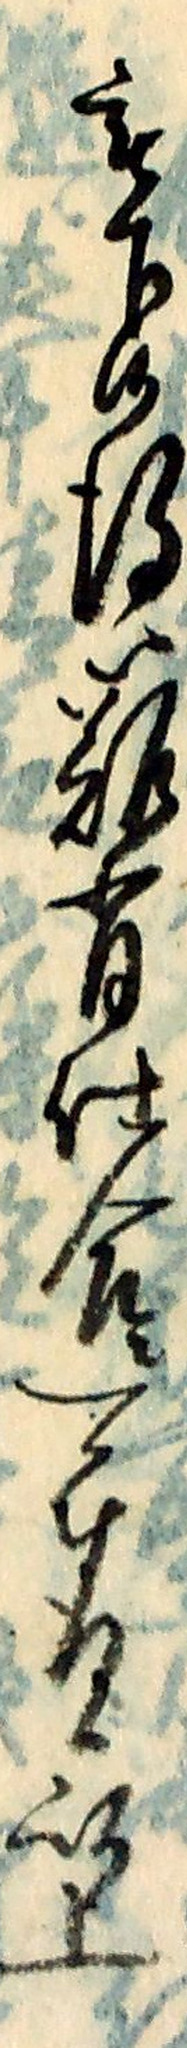被下候得は難有仕合に可奉存候以上
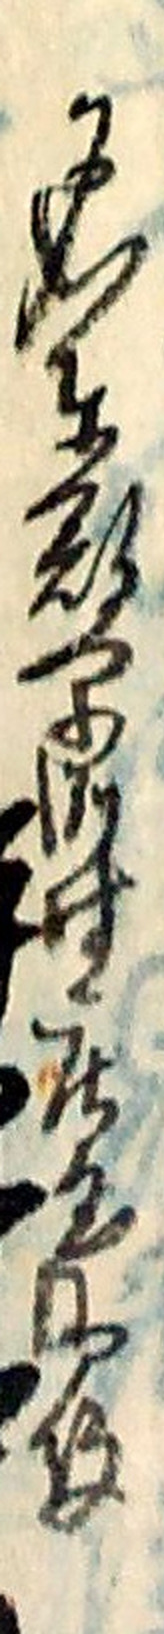名東郡早淵村庄屋助役
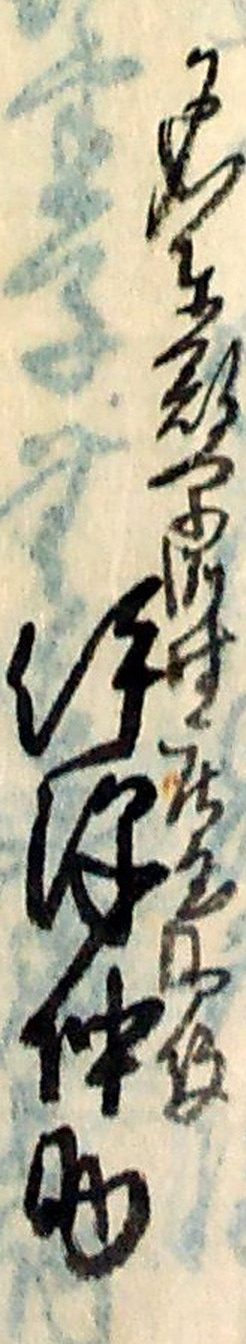伊沢仲助
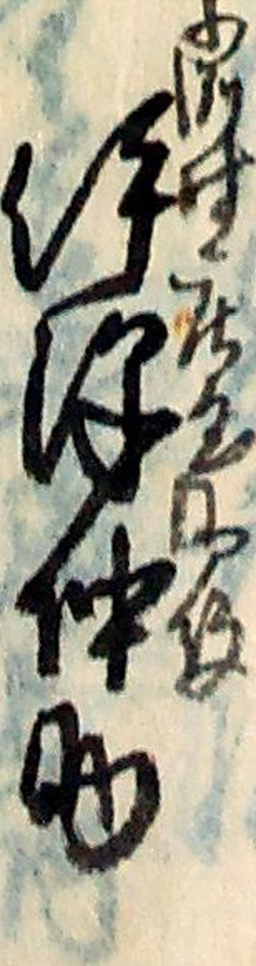伊沢仲助
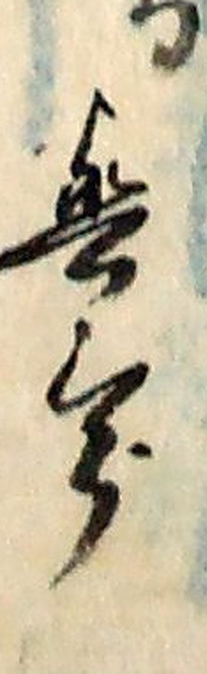与三郎
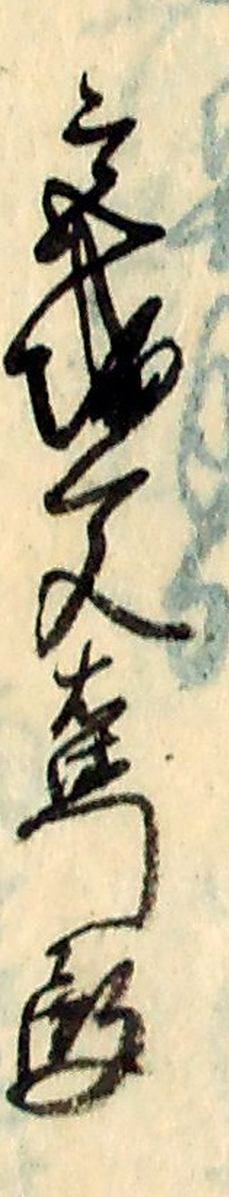宮城文右衛門殿同
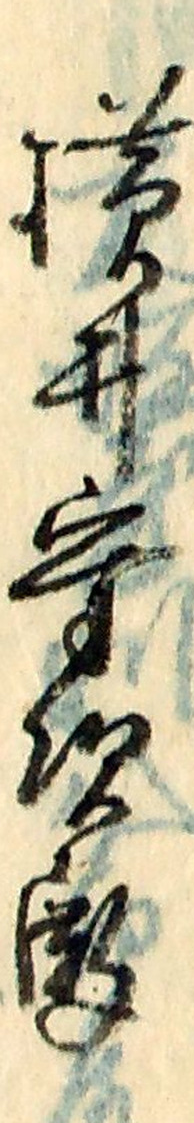横井守次殿
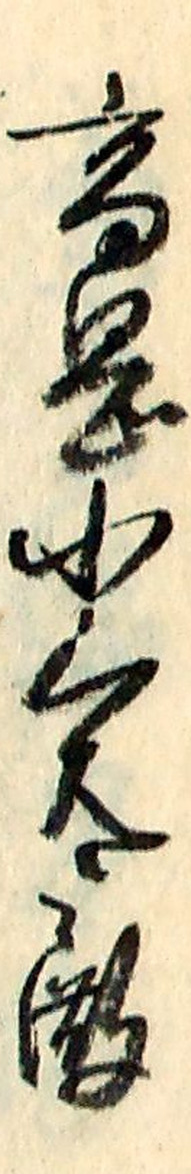高岡小三太殿

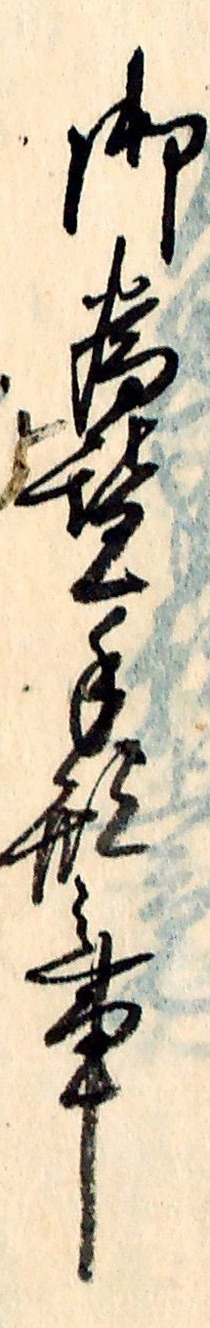御為替手形之事
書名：諸御願書控(後藤氏壱番）
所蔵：鳴門教育大学 Naruto University of Education
